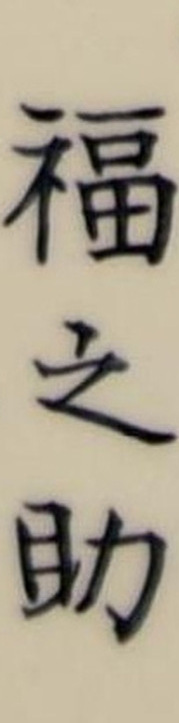福之助
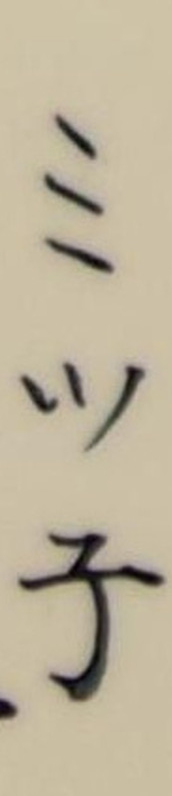ミツ子
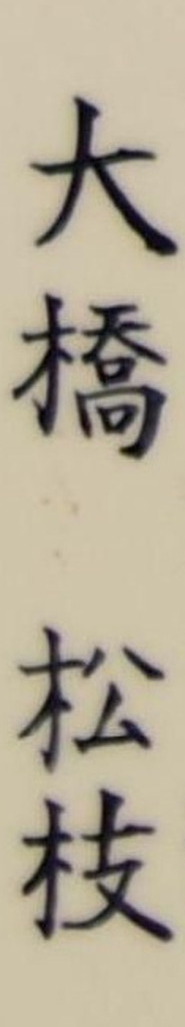大橋松枝
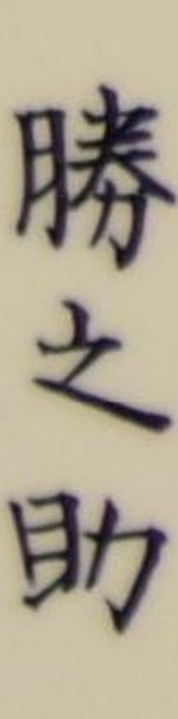勝之助
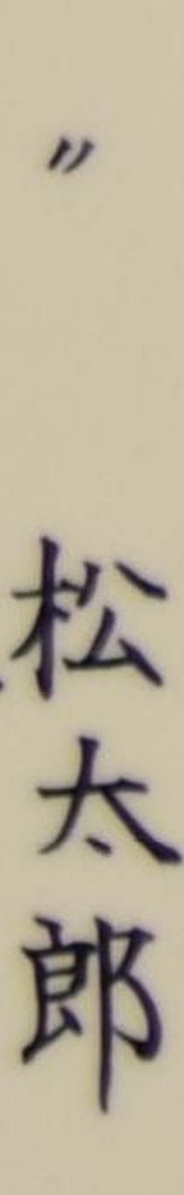松太郎
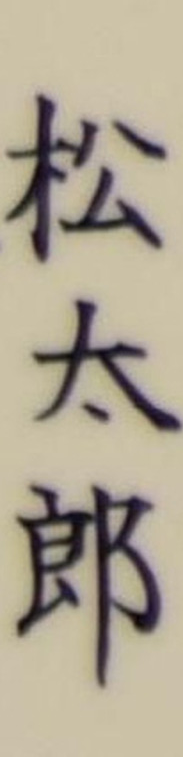松太郎
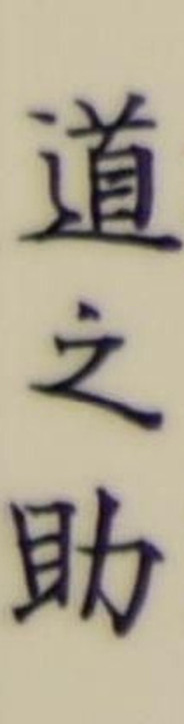道之助

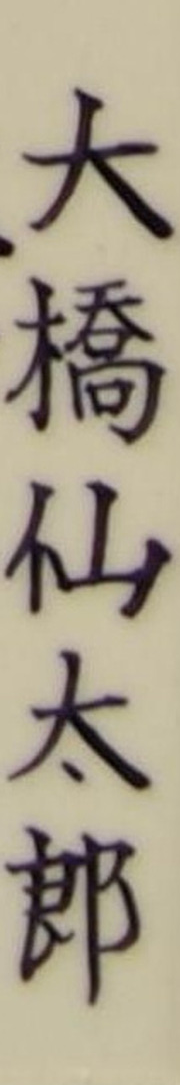大橋仙太郎
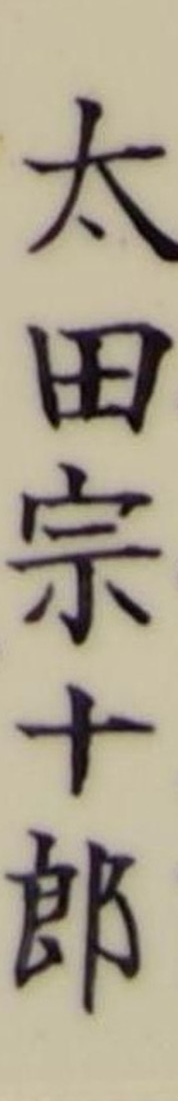太田宗十郎
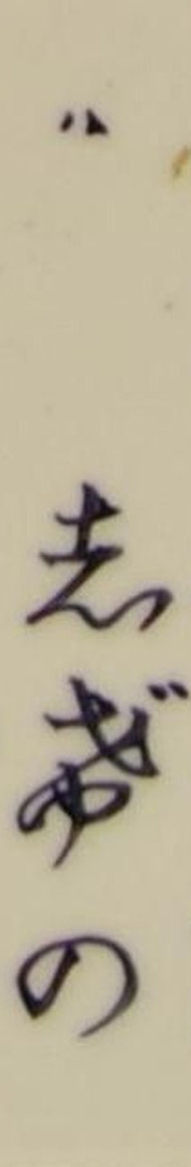しげの
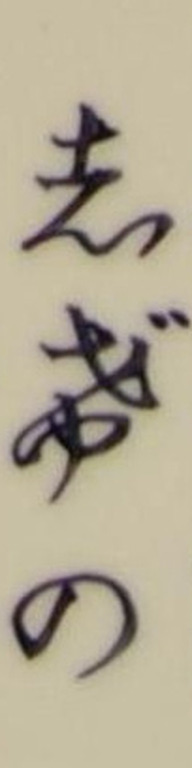しげの
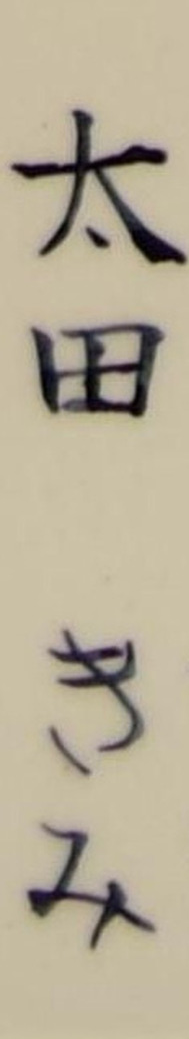太田きみ
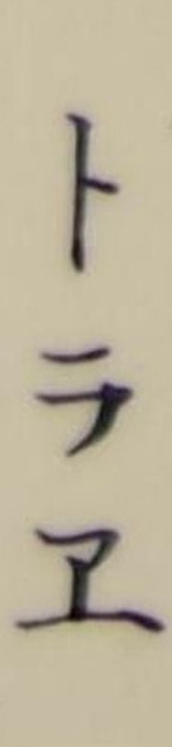トラヱ
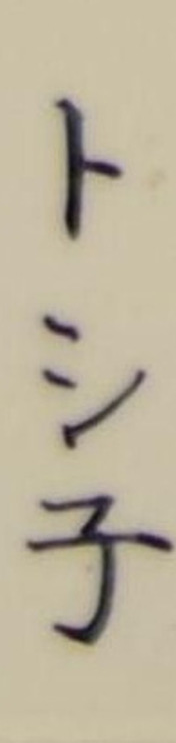トシ子
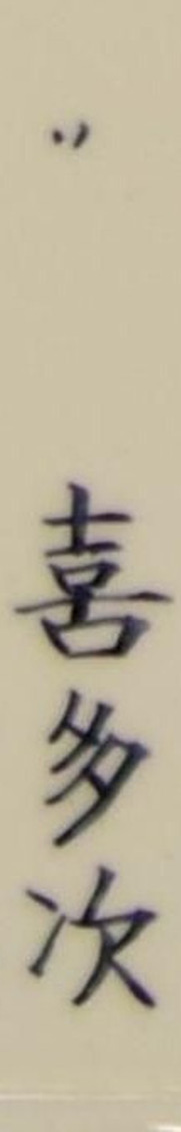喜多次
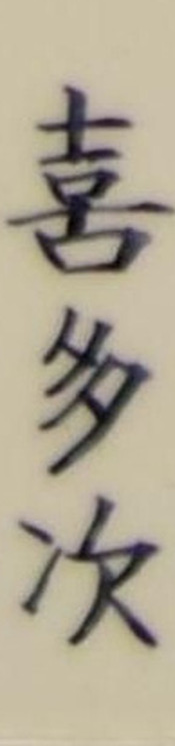喜多次
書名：A~D
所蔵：koyasan kongobuji
